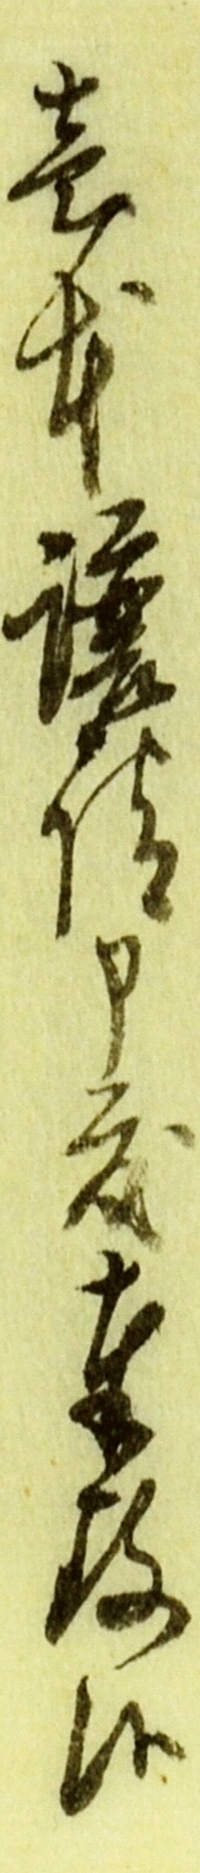壱本譲請申度奉存候
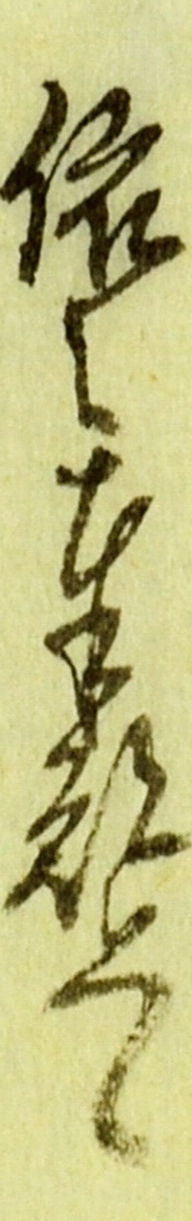依之奉願上候
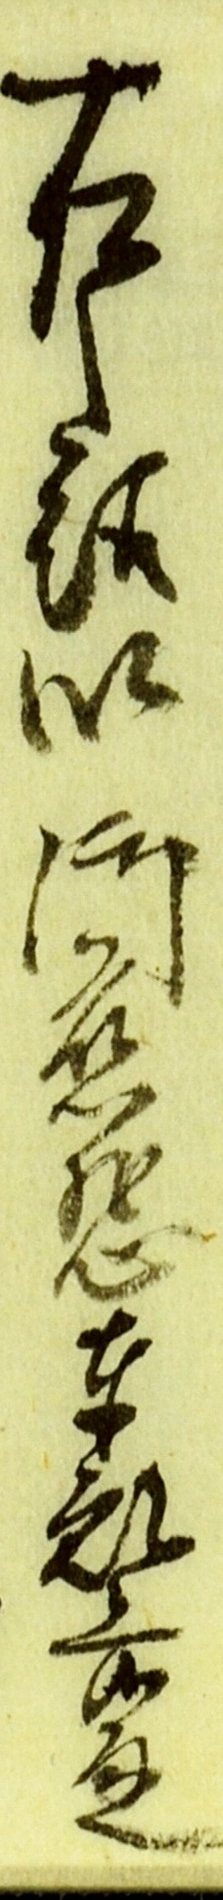右之趣以て御慈悲奉願上候通
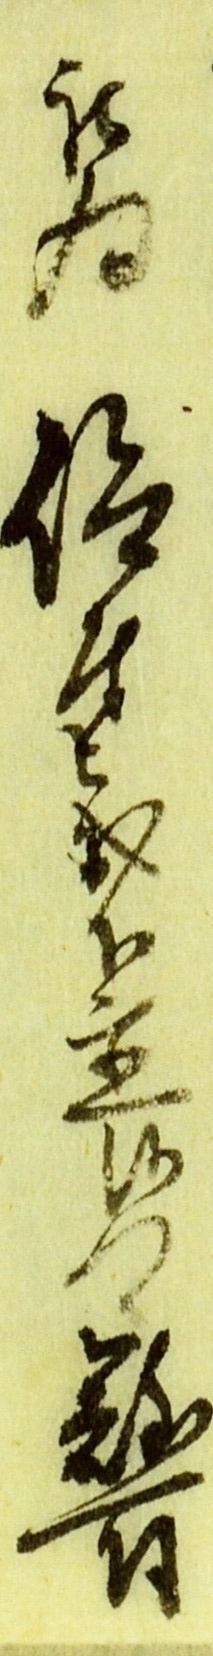被仰付被成下置候ハヽ難有
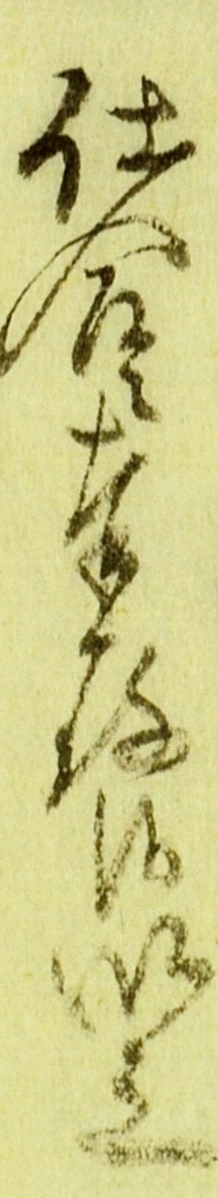仕合ニ奉存候以上
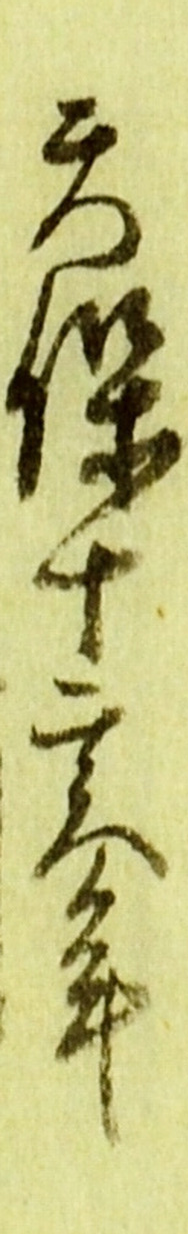天保十亥年
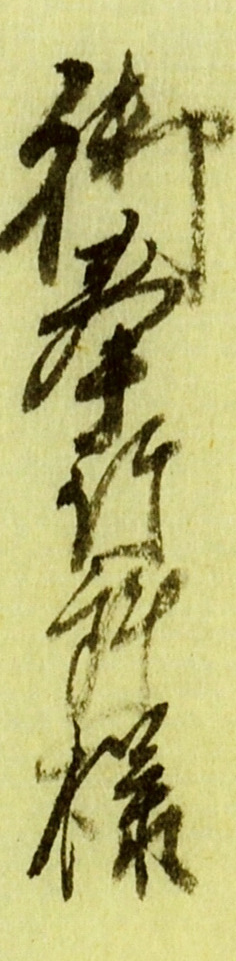御奉行所様
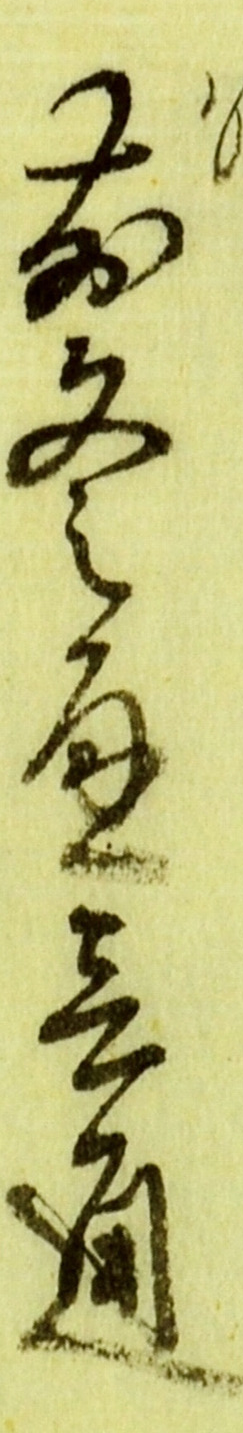前文之通壱通
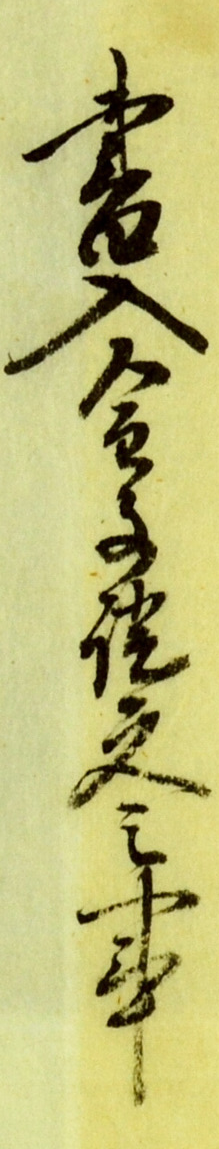書入金子証文之事
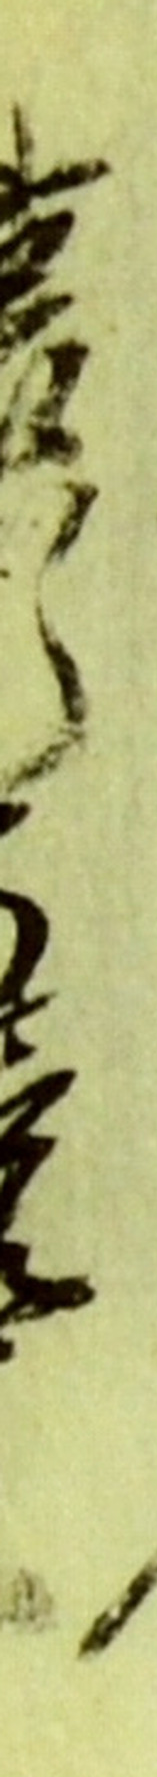裏行大境迄

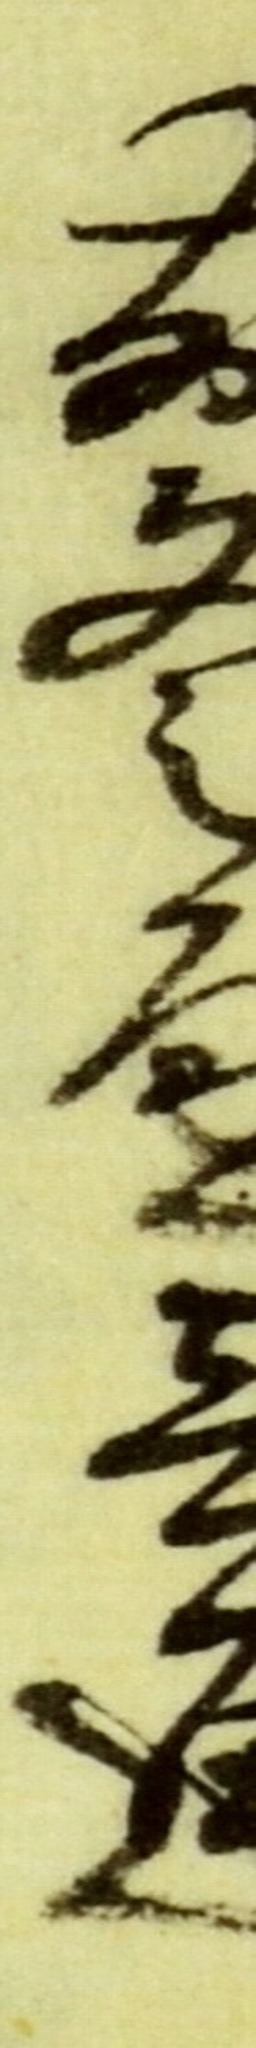前文之通壱通
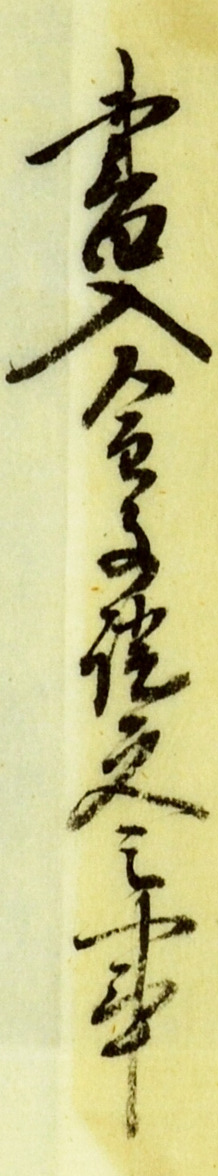書入金子証文之事
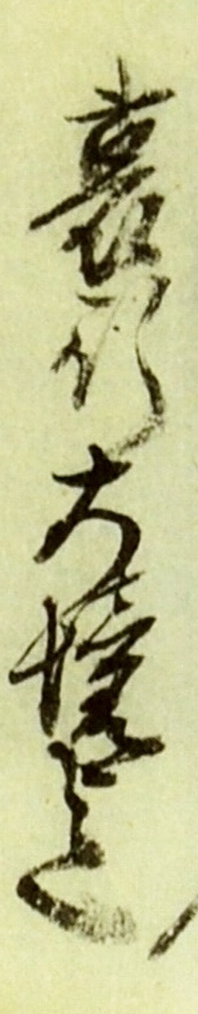裏行大境迄
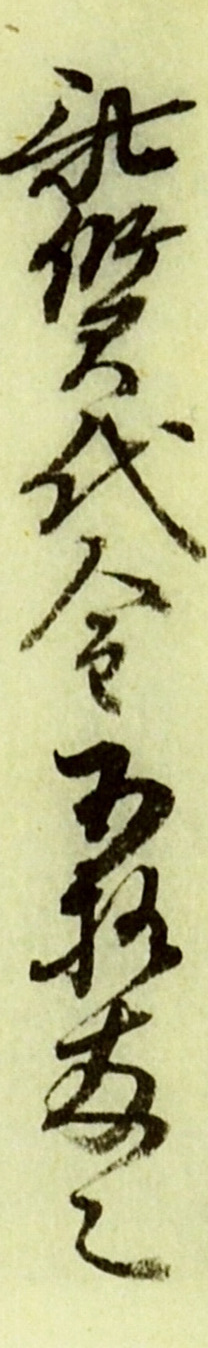此質大金五拾両也
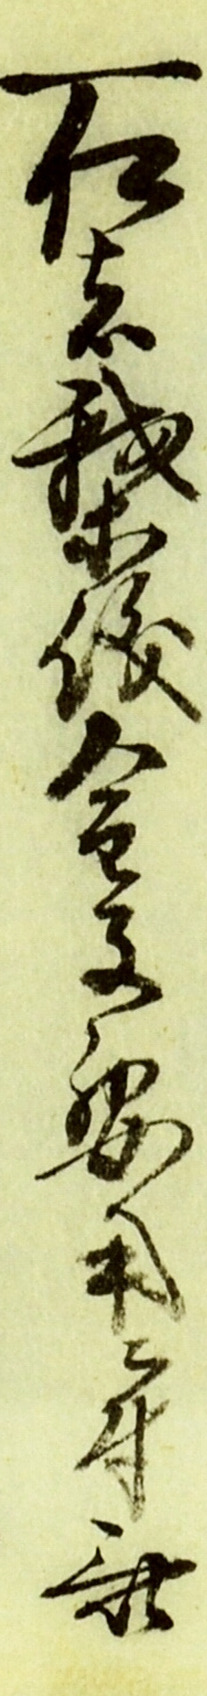右者我等儀金子要用ニ付此
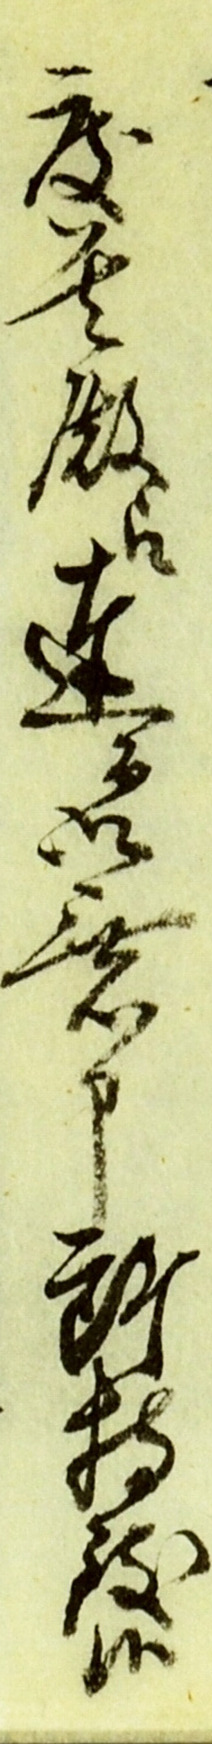度貴殿江達而御無心申所持致候
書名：造酒株一件始末
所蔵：伊那市立高遠町図書館・合同会社AMANE
